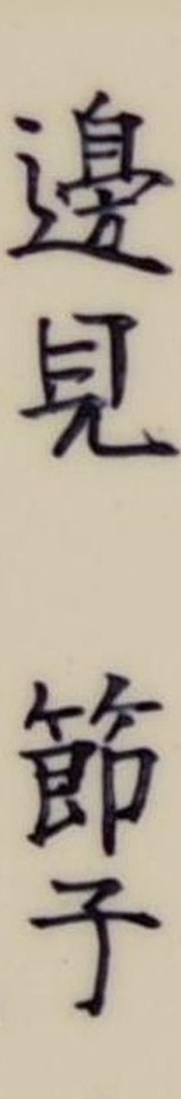邊見節子
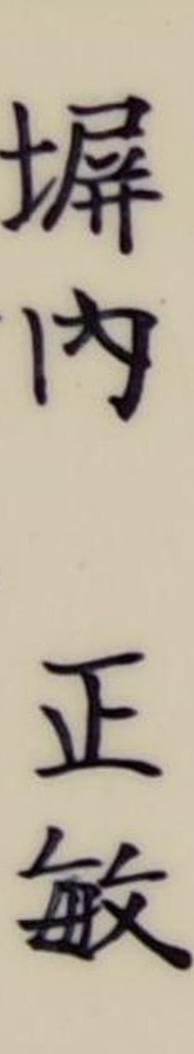塀内正敏
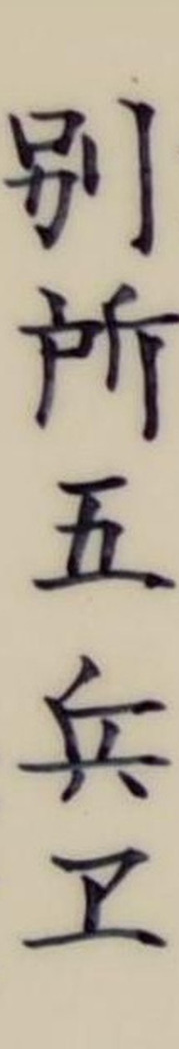別所五兵ヱ
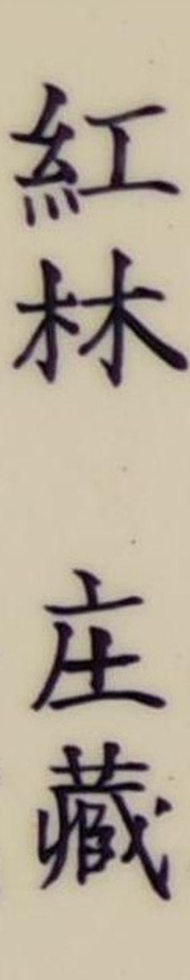紅林庄蔵
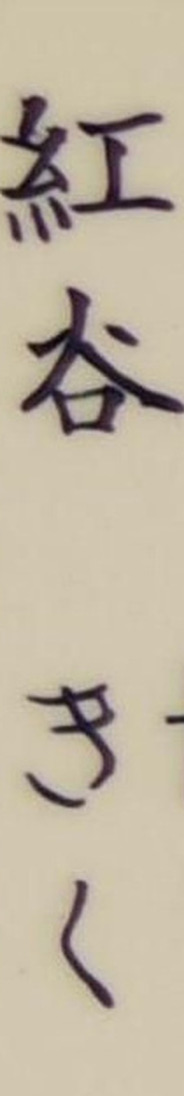紅谷きく
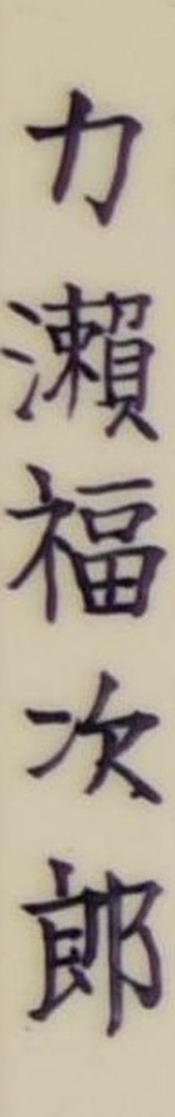カ瀬福次郎

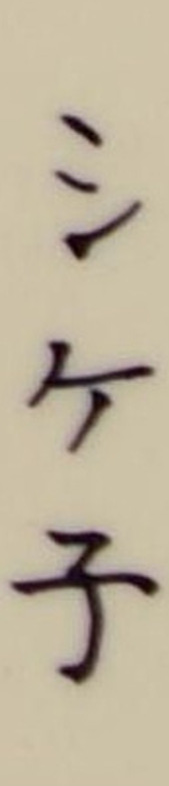シケ子
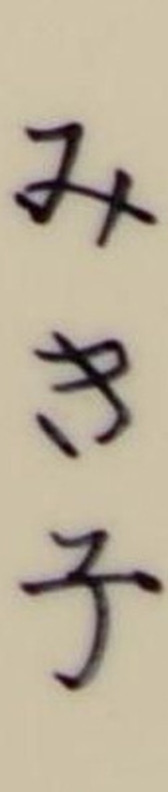みき子
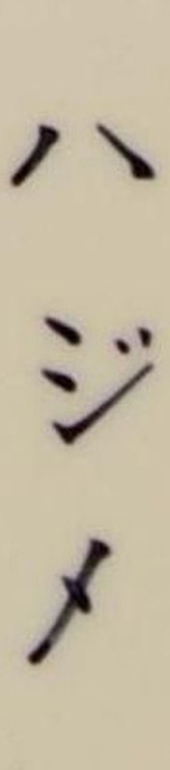ハジメ
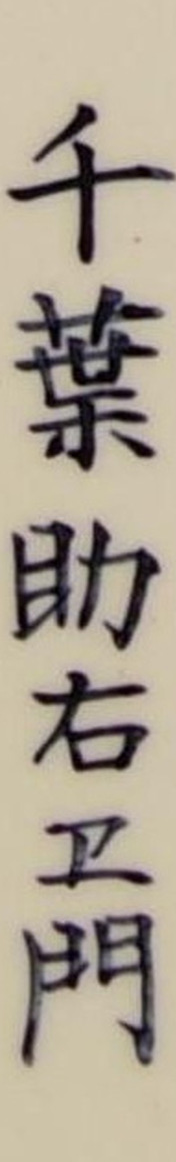千葉助右ヱ門
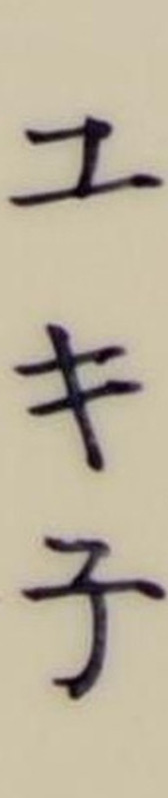ユキ子
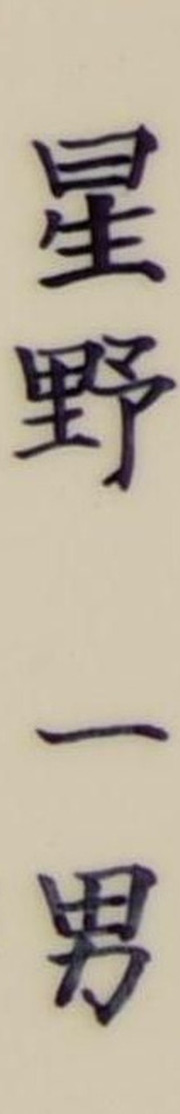星野一男

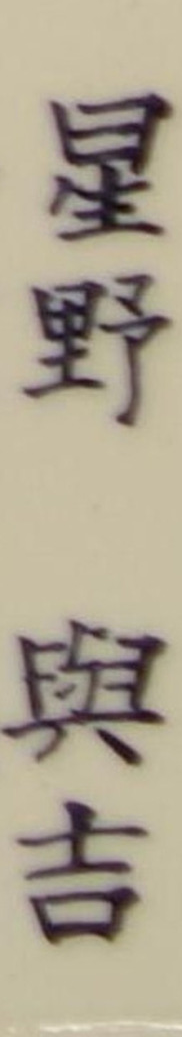星野與吉
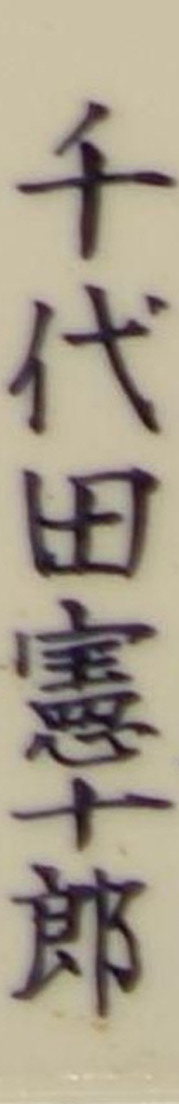千代田憲十郎
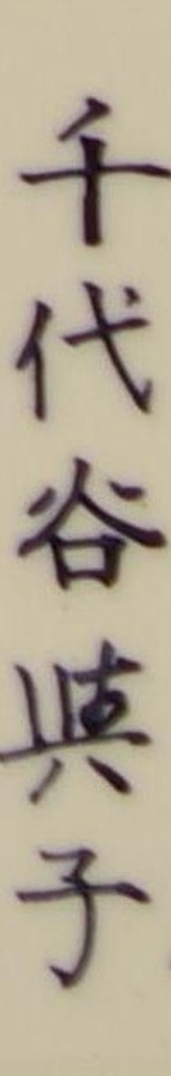千代谷与子
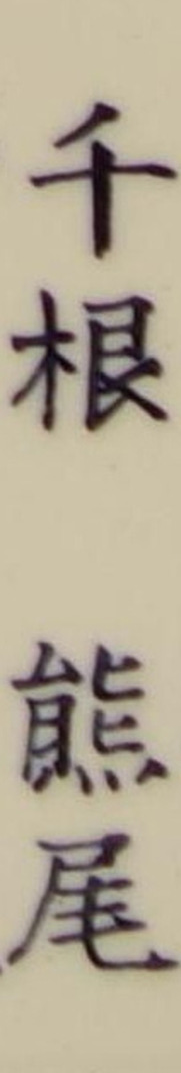千根熊尾
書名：A~D
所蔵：koyasan kongobuji
